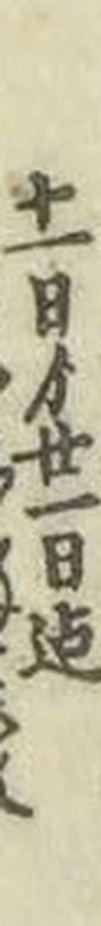十一日ゟ廿一日迄
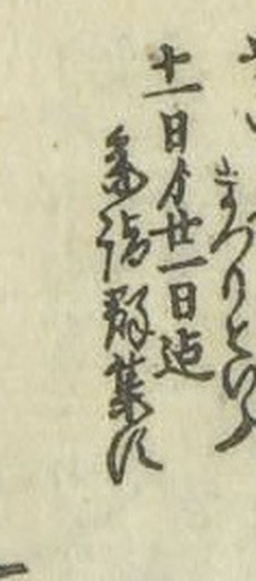参詣群集す
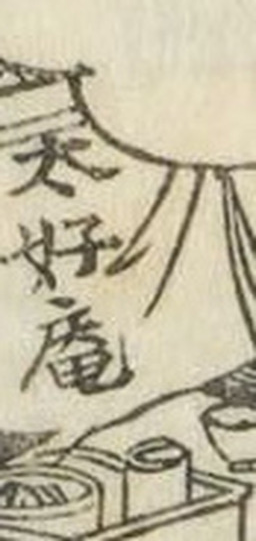太好庵

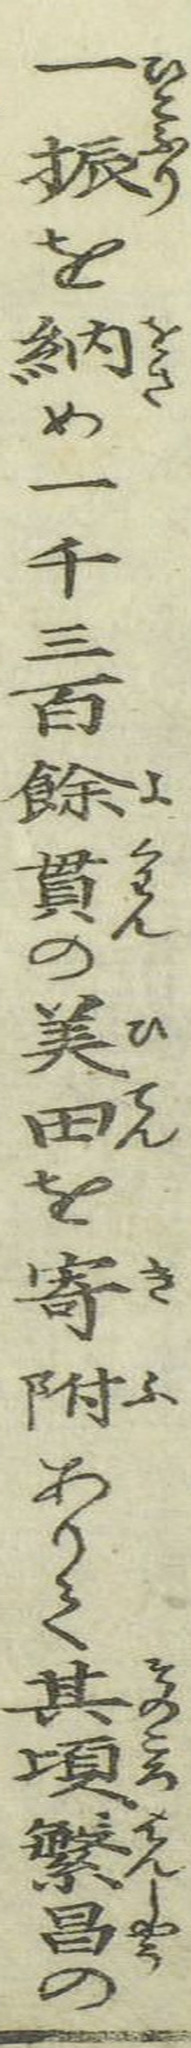一振を納め一千三百餘貫の美田を寄附ありて其頃繁昌の
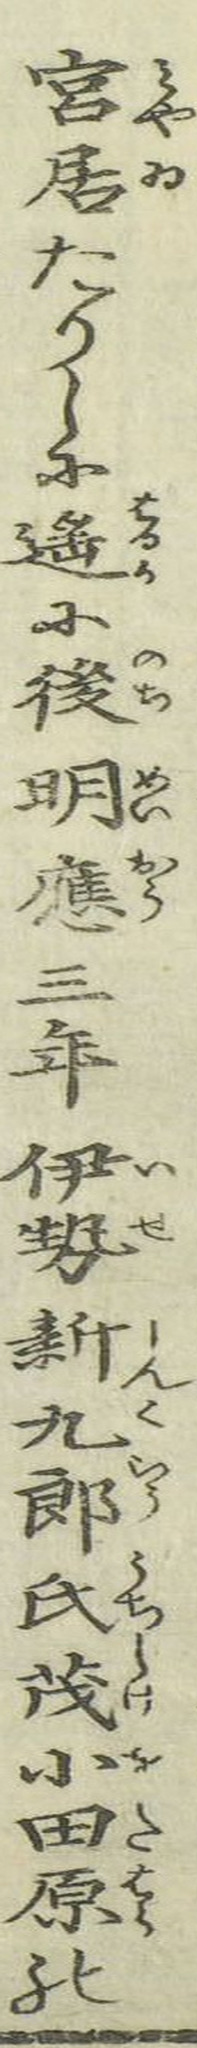宮居たりしに遥に後明應三年伊勢新九郎氏茂小田原の
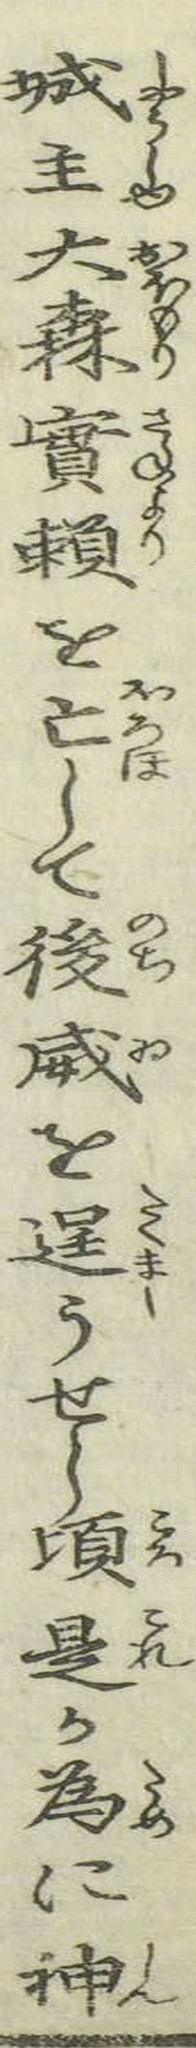城主大森實頼を亡して後威を逞うせし頃是か為に神
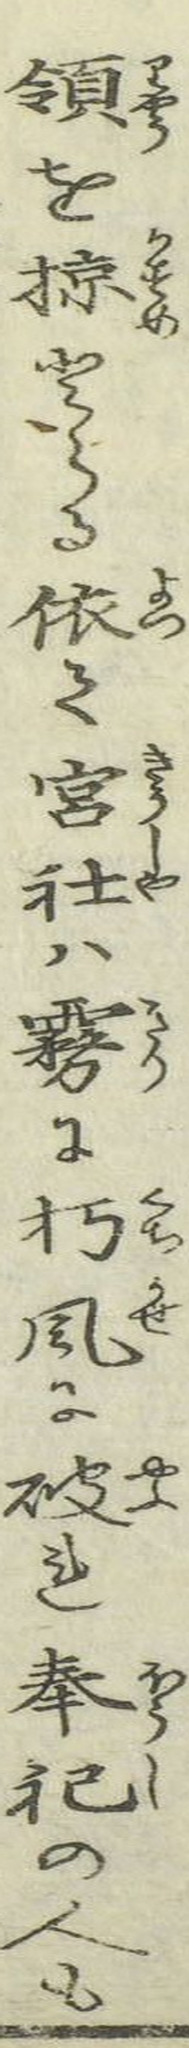領を掠とらる依て宮社は霧に朽風に破れ奉祀の人も
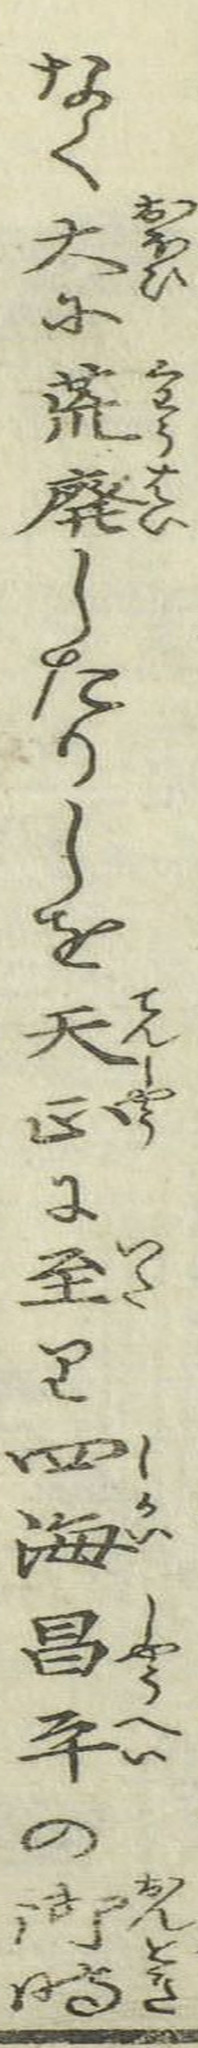なく大に荒廃したりしを天正に至り四海昌平の御時
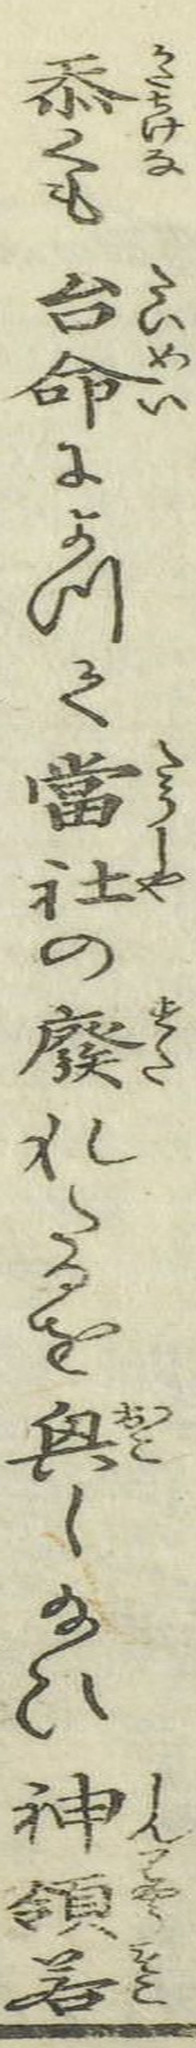忝くも台命によつて當社の廃れたるを興し給ひ神領若
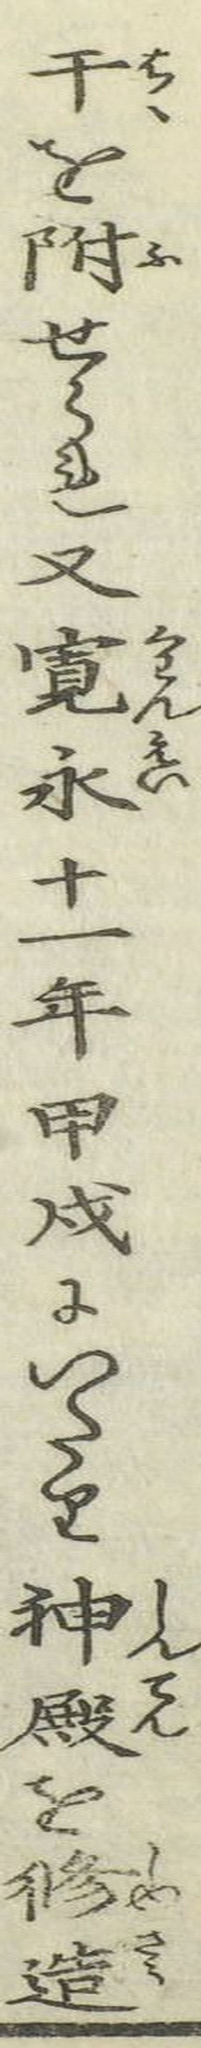干を附せられ又寛永十一年甲戌にいたり神殿を修造
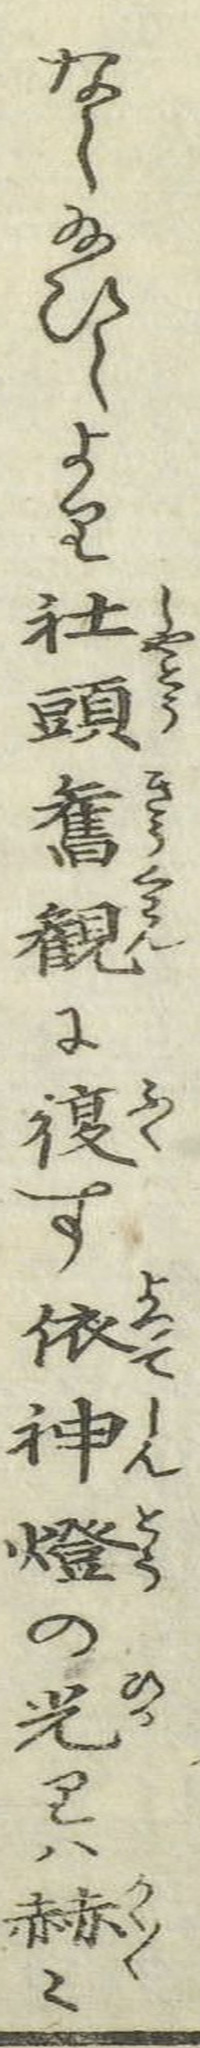なし給ひしより社頭舊観に復す依神燈の光りは赫々
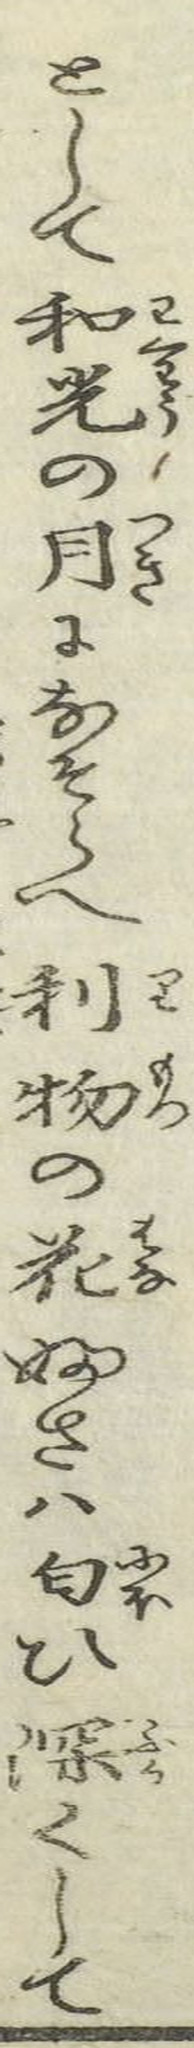として和光の月になそらへ利物の花ふさは匂ひ深くして
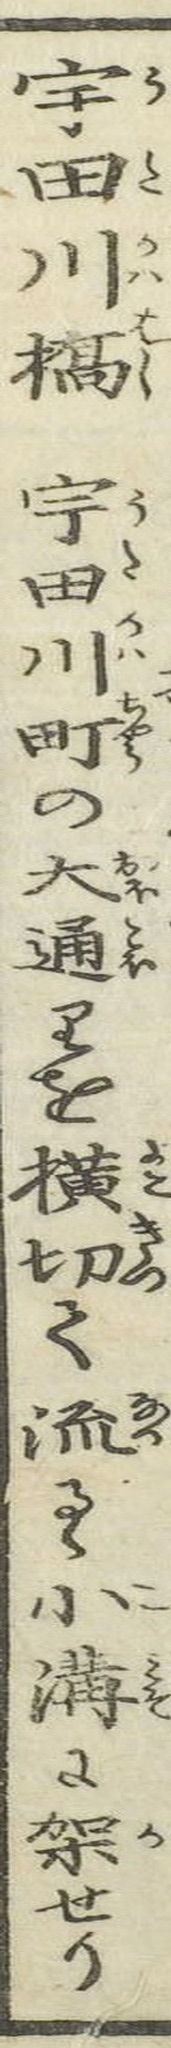宇田川橋宇田川町の大通りを横切て流るゝ小溝に架せり
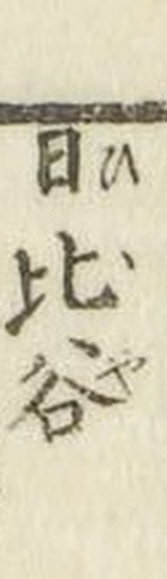日比谷
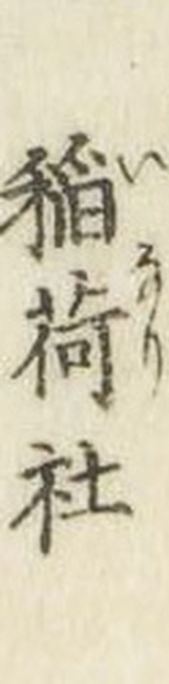稲荷社
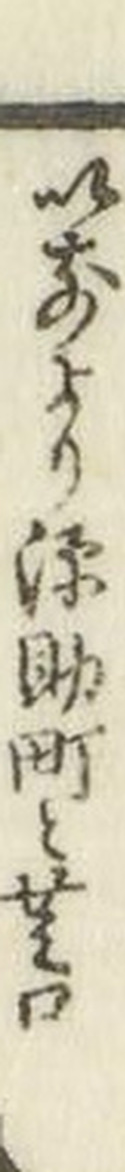以前より源助町と芝口
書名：江戸名所図会 20巻 巻之3
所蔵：東京学芸大学教育コンテンツアーカイブ
